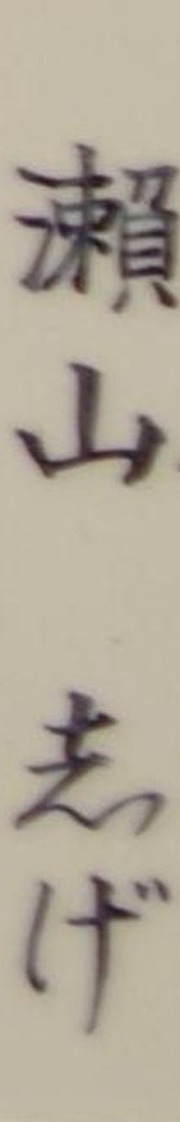瀬山しげ
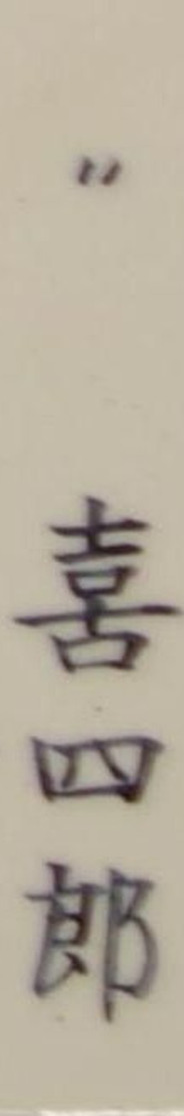喜四郎
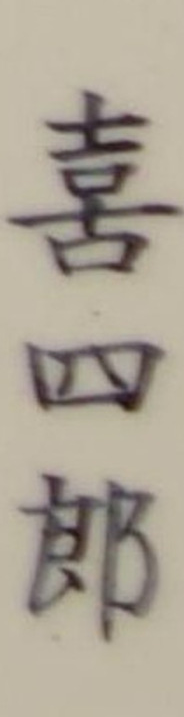喜四郎
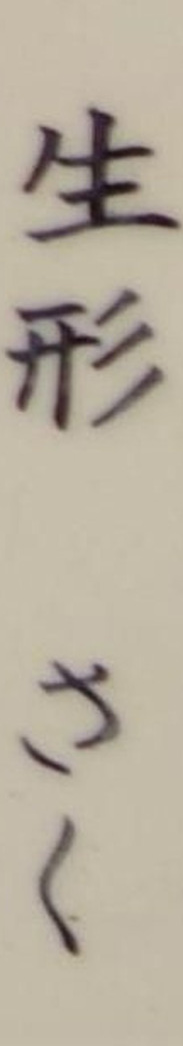生形さく
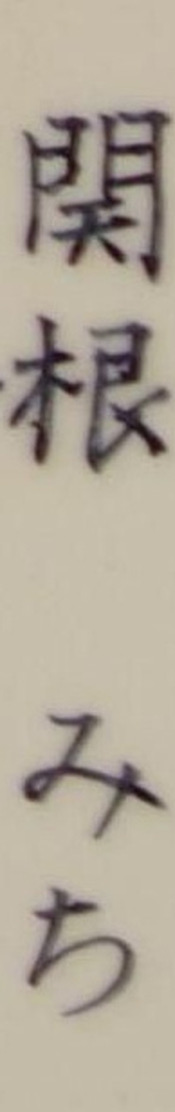開根みち
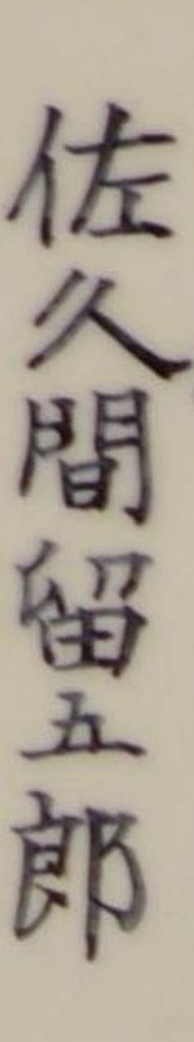佐久間留五郎
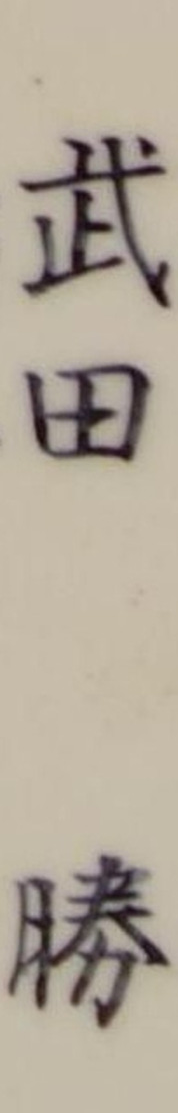武田勝
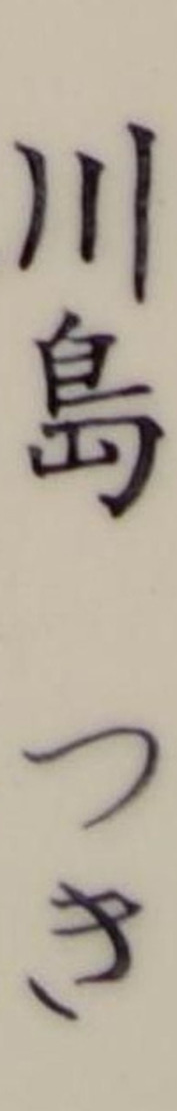川島つき
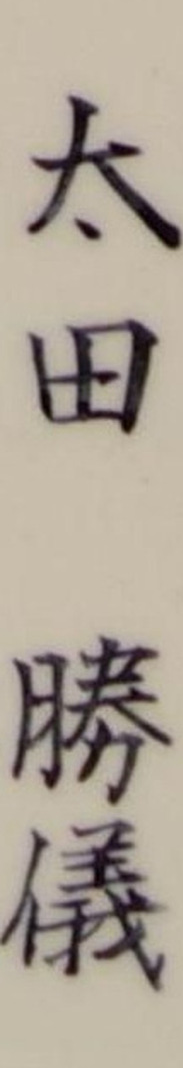太田勝儀
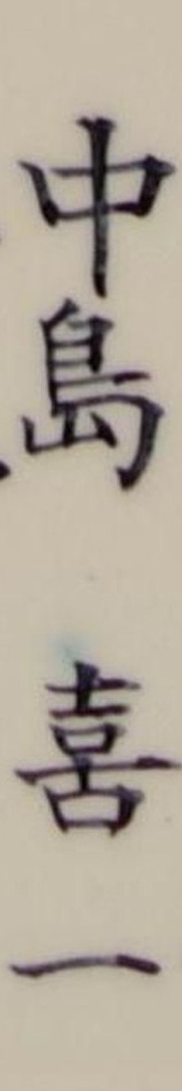中島喜一
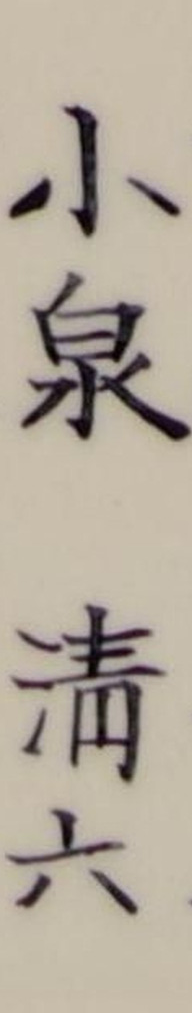小泉清六
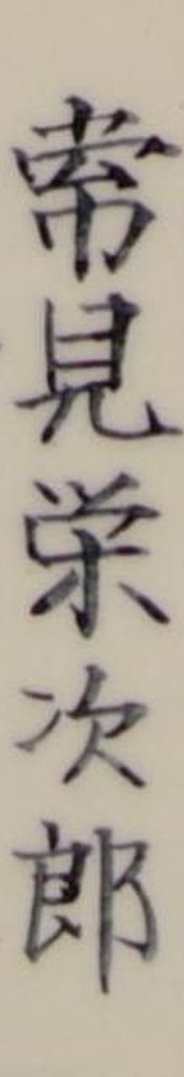常見栄次郎
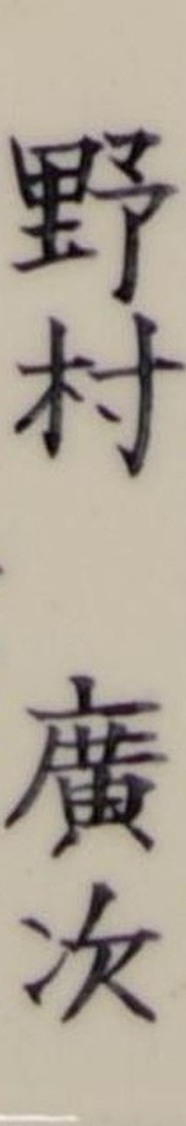野村廣次
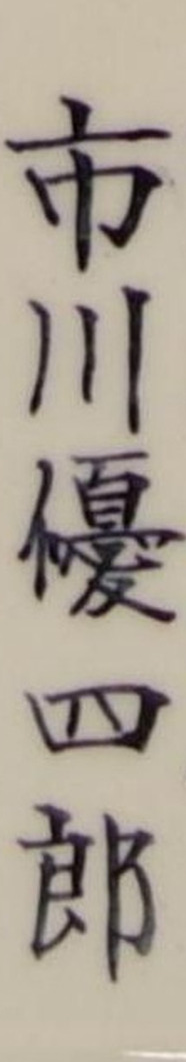市川優四郎
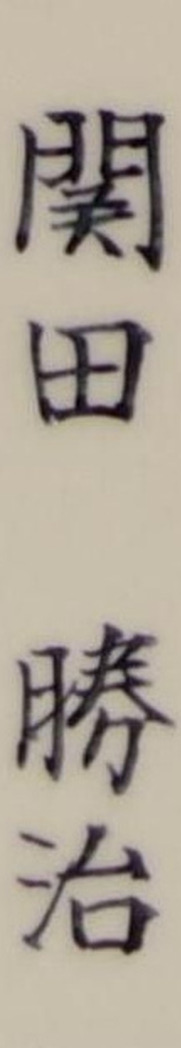関田勝治
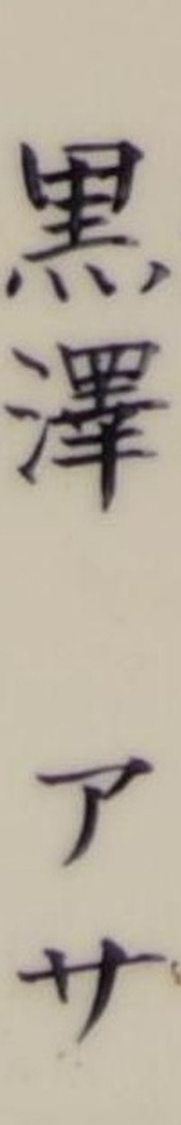黒澤アサ
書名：M~S
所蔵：高野山金剛峯寺
